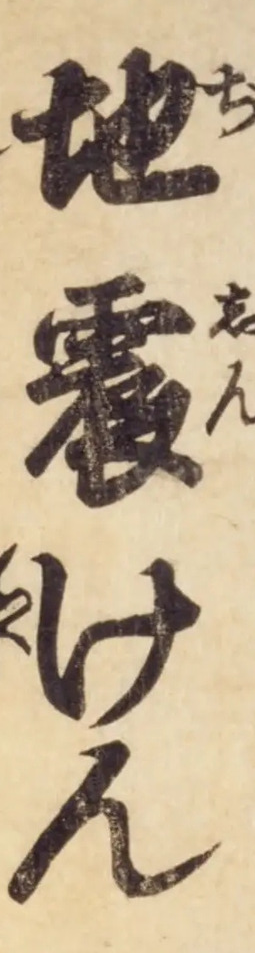地震けん
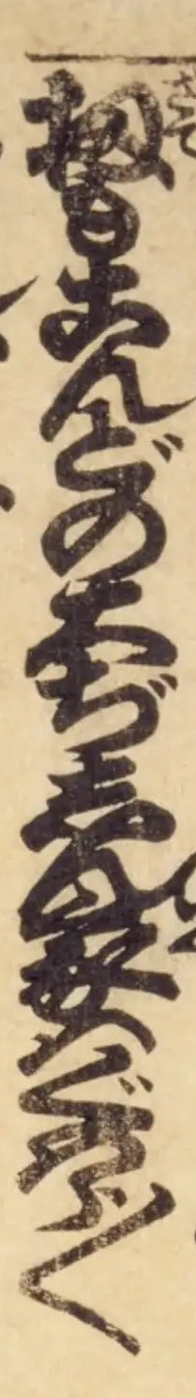「扨もこんどの大ぢしん家はぐはら〳〵
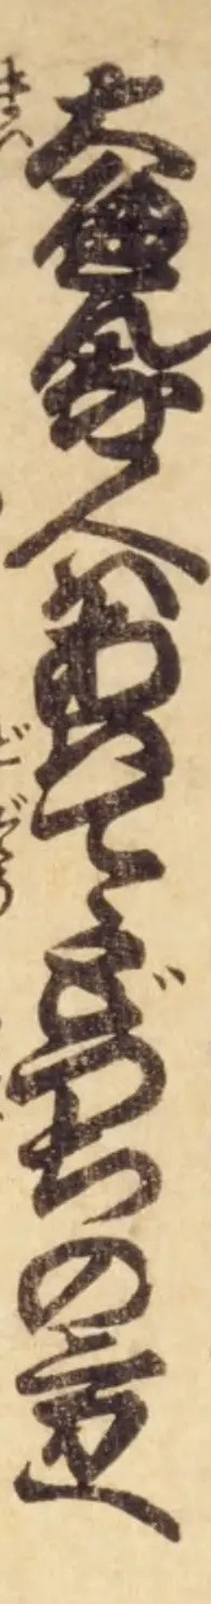大へんな人はあはてゝどつちの方へ
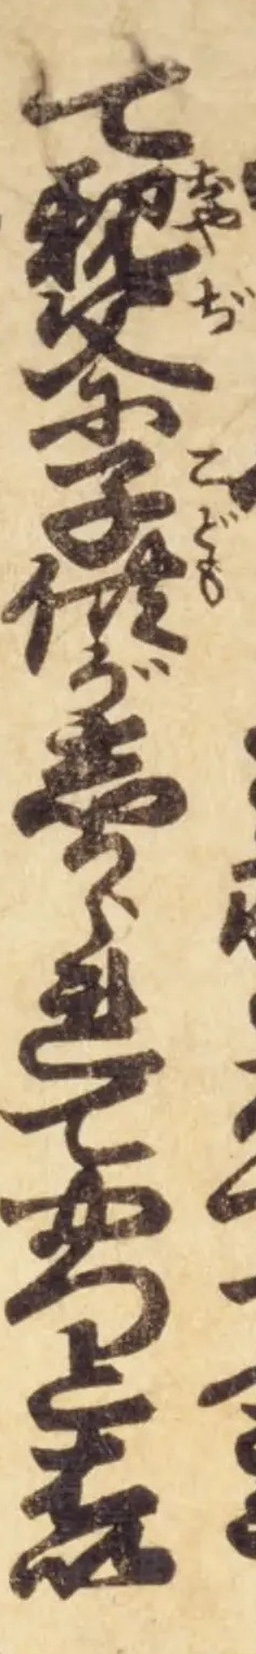て親父に子供がしかられてやつとはい
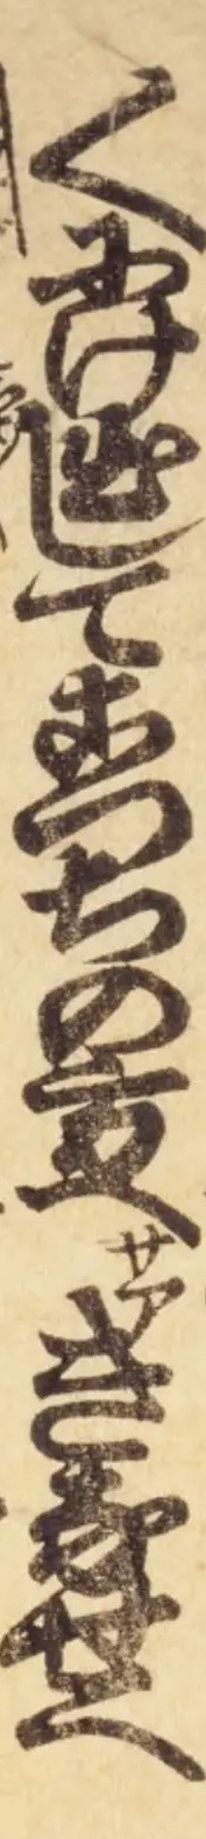〳〵にけ出してこつちの方へサアきなせへ
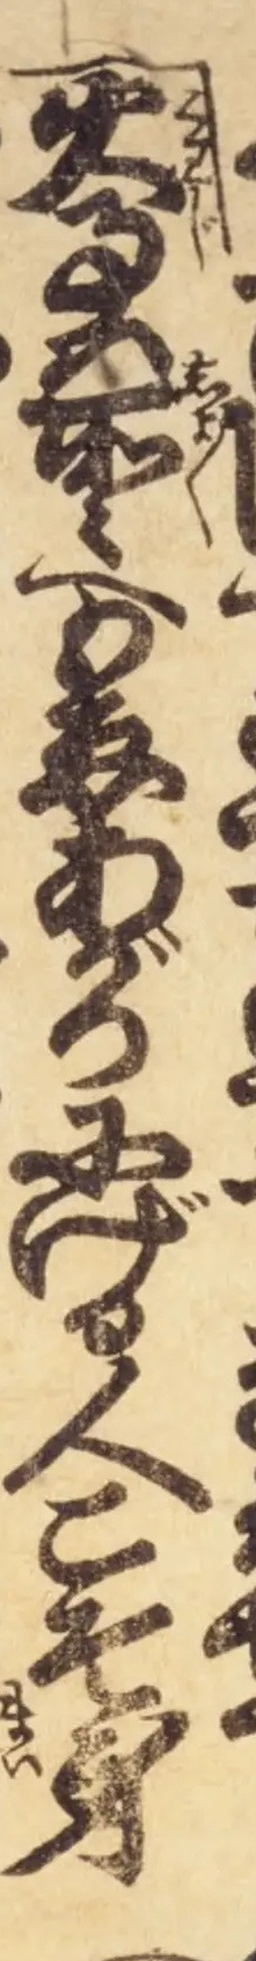「火事は所々へもゑあがりにげる人こそ身
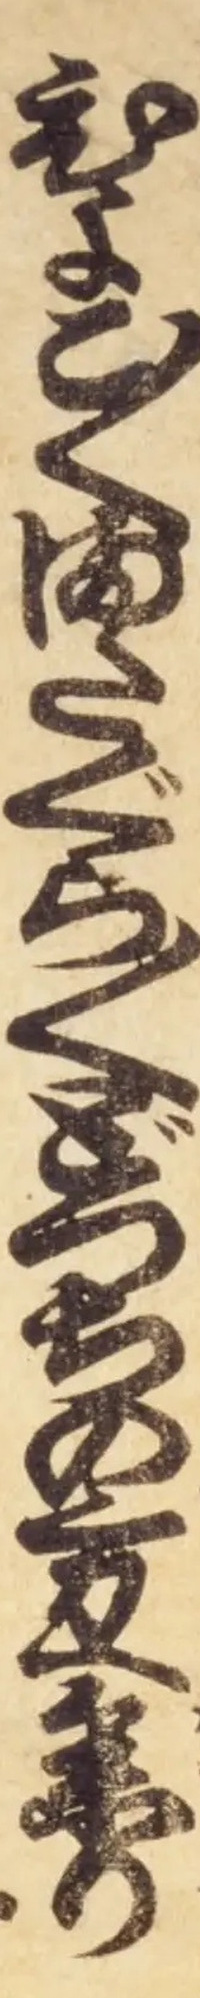ひよこ〳〵またぐら〳〵どつちの方へ参り
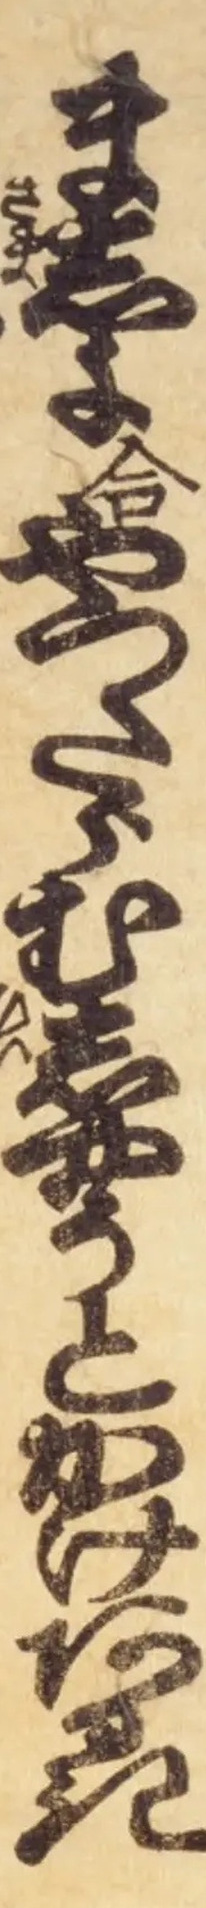ましよ合やつたらむしやうとかけあるき
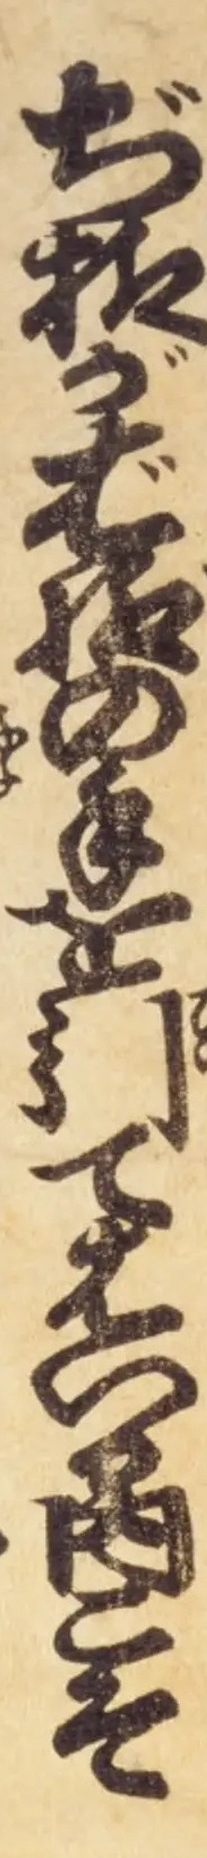ぢ様がば様の手を引てはいる内こそ
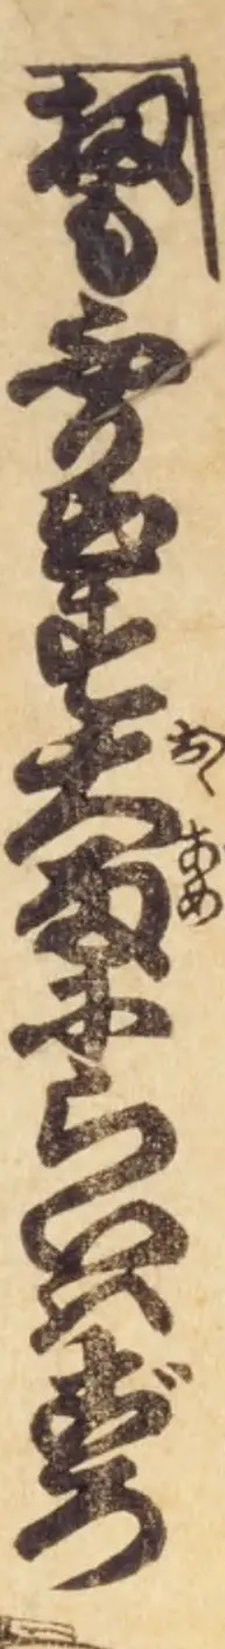「扨もふり出す大雨にらいはじろ
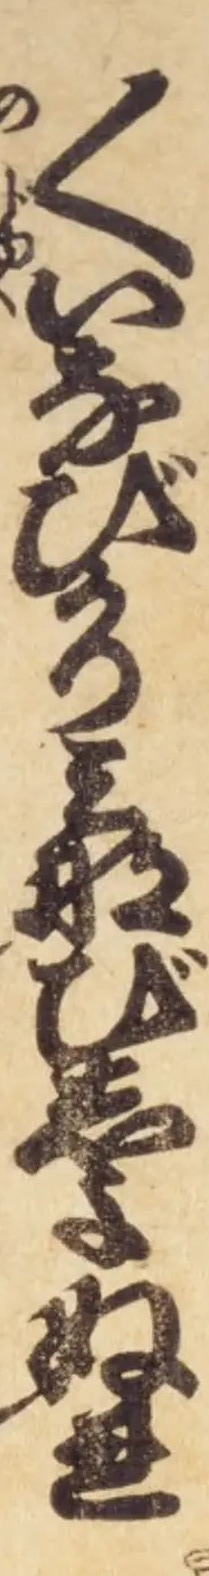〳〵いなびかりみなびしよぬれ
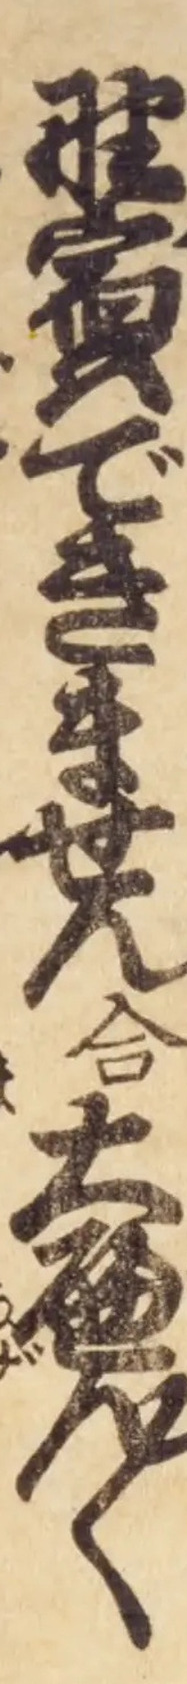野宿はできません合大へん〳〵
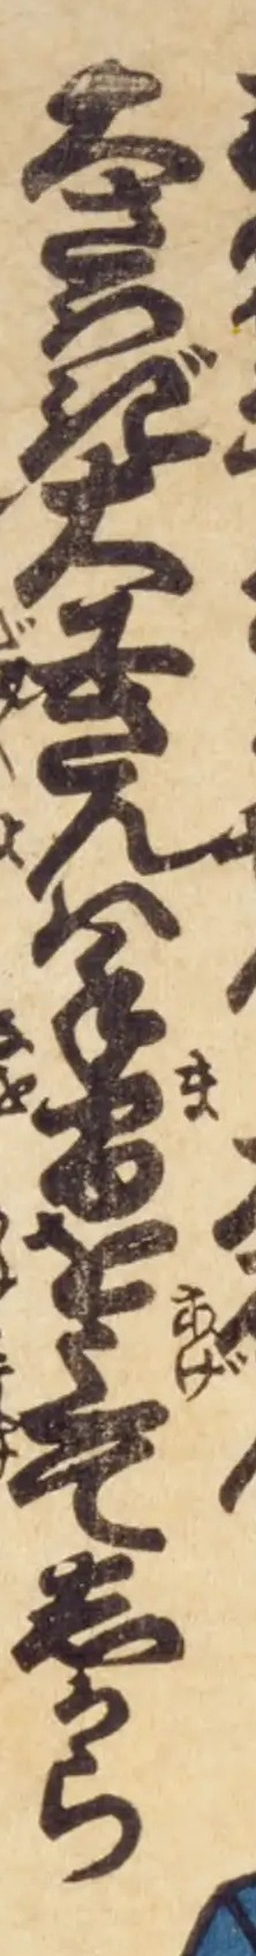大さはぎ大工さんは手間を上てしから
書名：地震けん
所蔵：国立国会図書館 National Diet Library, JAPAN
